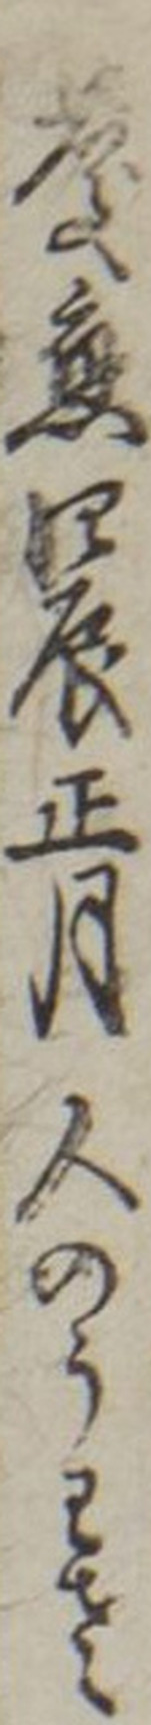慶應四辰正月人のうわさ
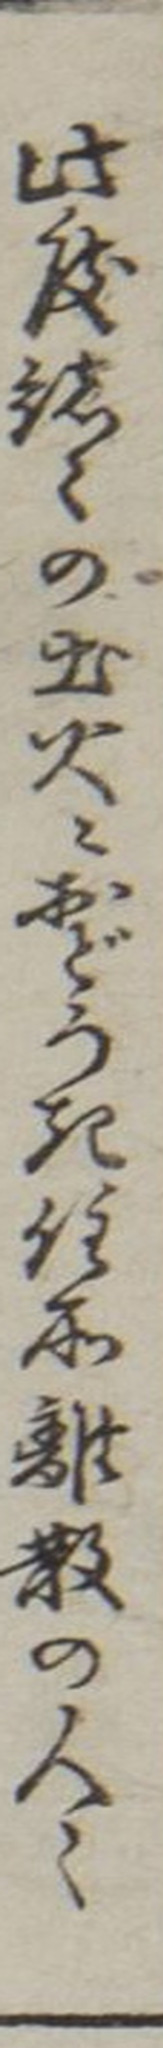此度諸ゝの出火におどろき住所離散の人ゝ
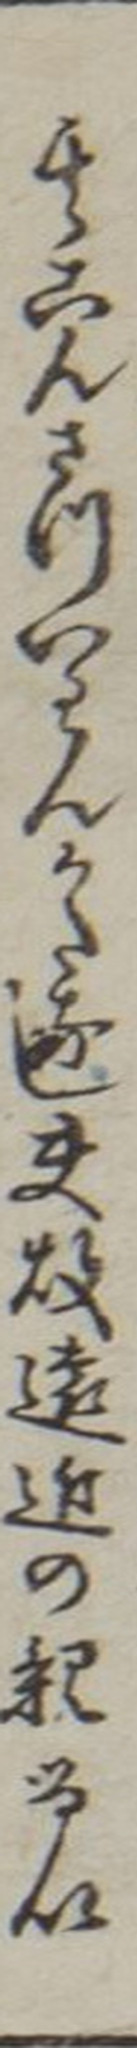其こんさついわんかたなし夫故遠近の親るい
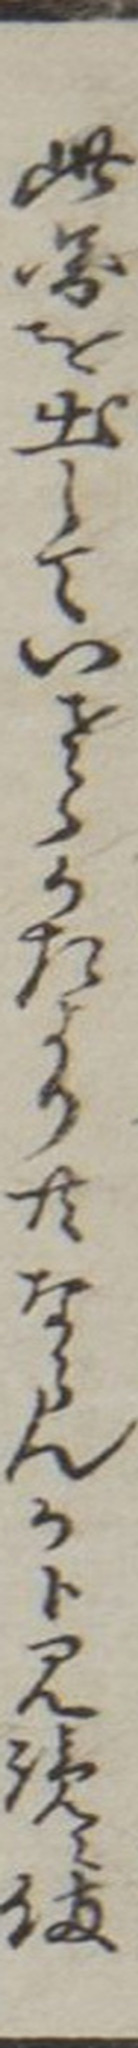此図を出していさゝかたより共ならんかト見読に備
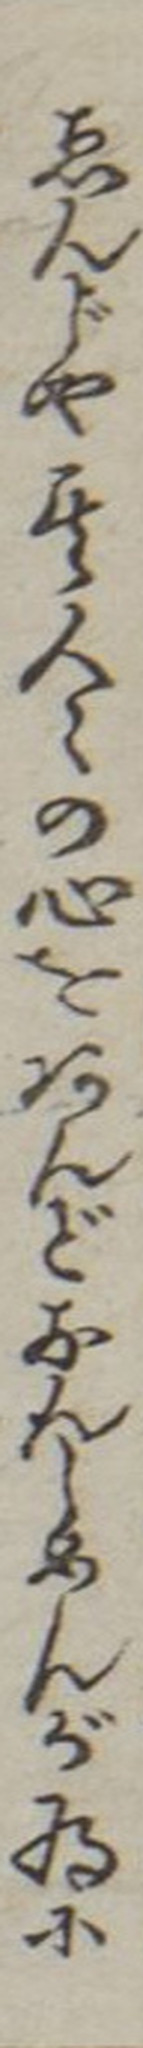ゑんじや其人ゝの心をあんどなんしめんが為に
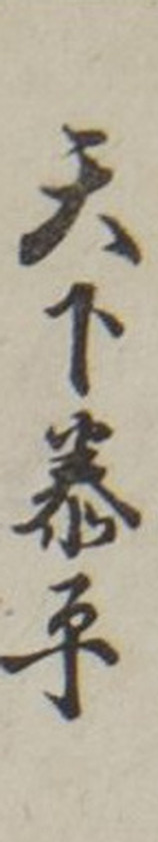天下泰平
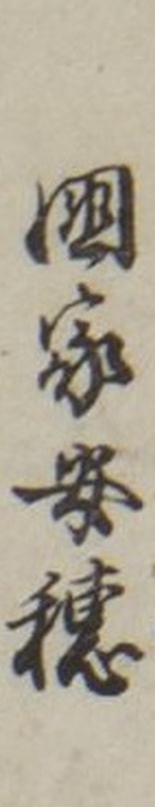国家安穂
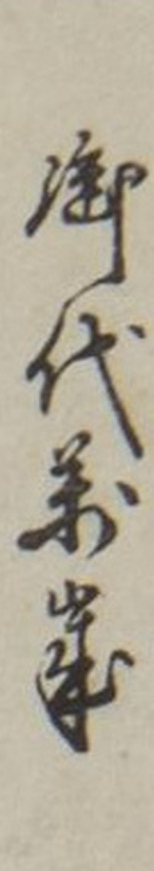御代万歳
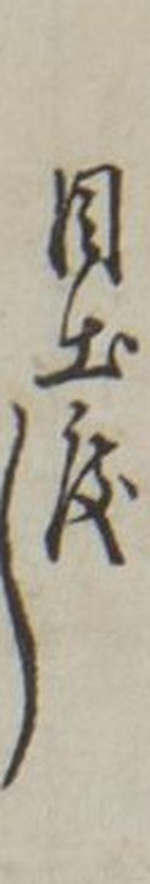目出度
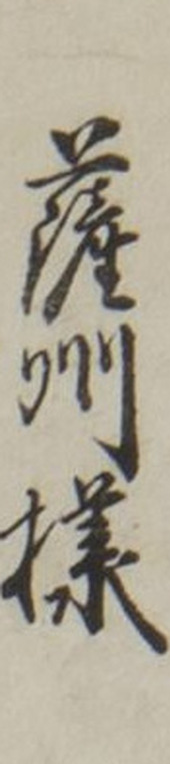薩州様
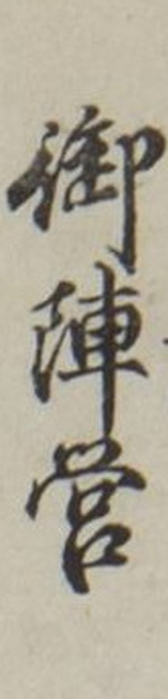御陣営
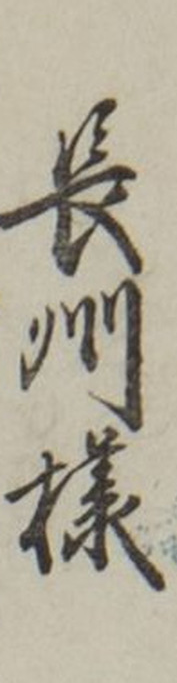長州様
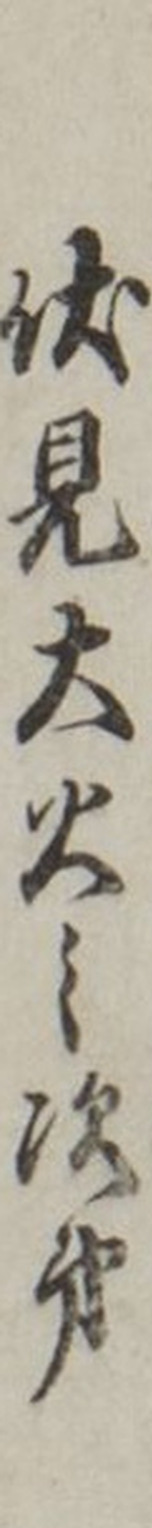伏見大火之次第
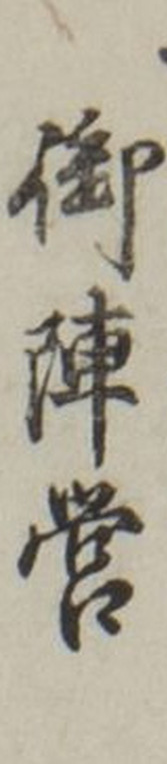御陣営
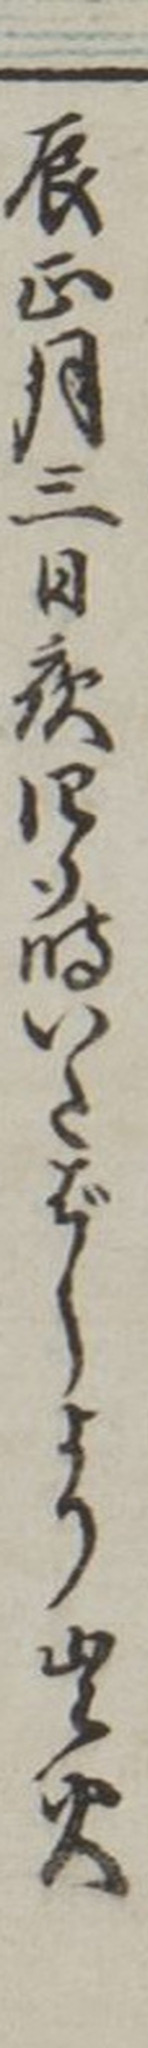辰正月三日夜四ツ時いたばしより出火
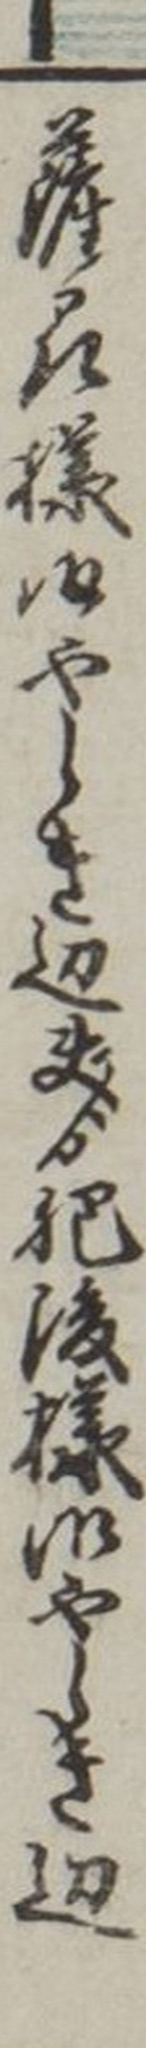薩州様御やしき辺夫より肥後様御やしき辺
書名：大阪・伏見出火の図
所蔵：あいおいニッセイ同和損保株式会社
